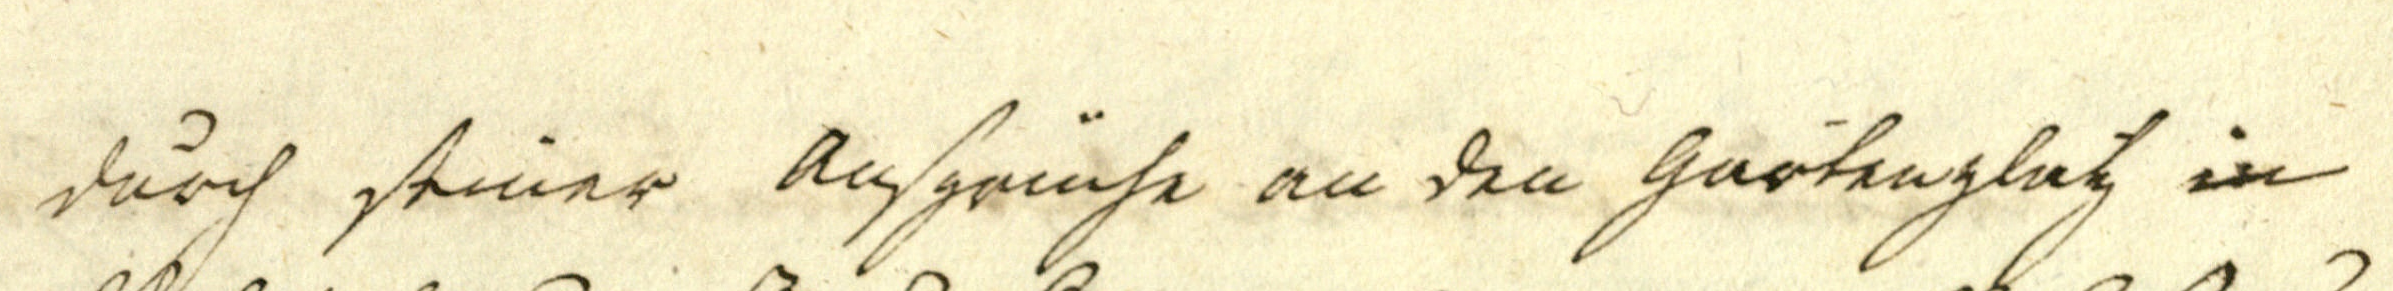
durch seiner Ansprüche an den Gartenplatz in
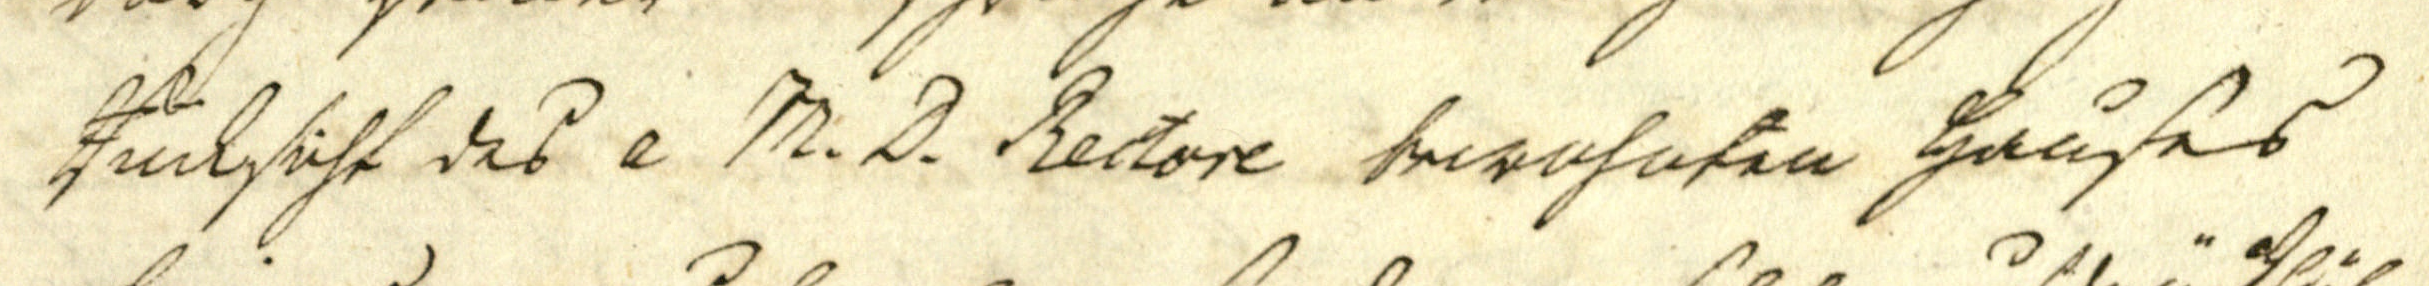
Rücksicht des a M. D. Rector bewohnten Hauses
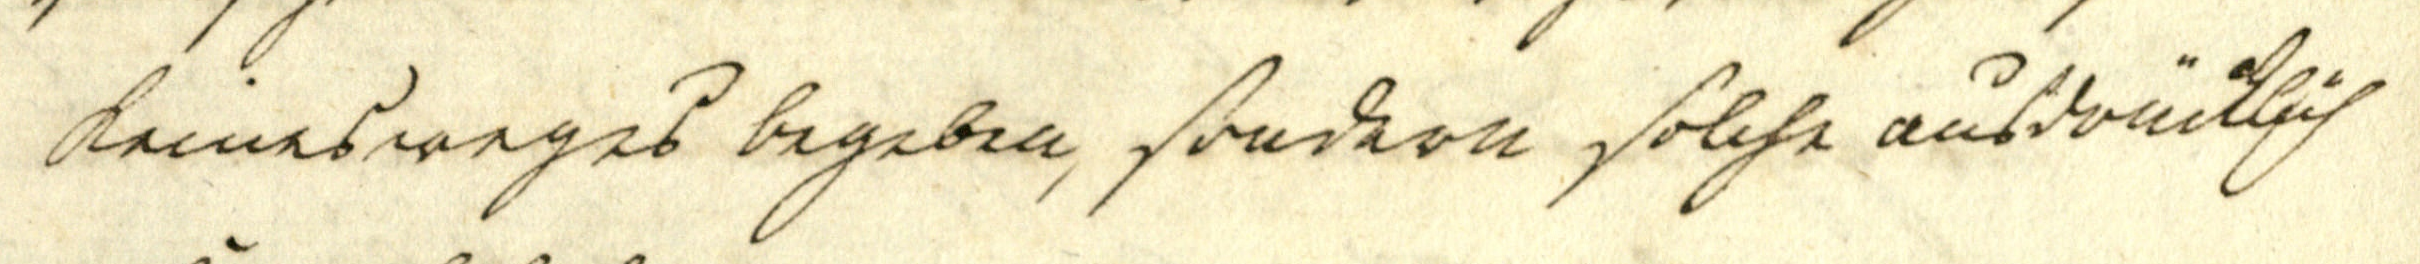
keinesweges begeben, sondern solche ausdrücklich
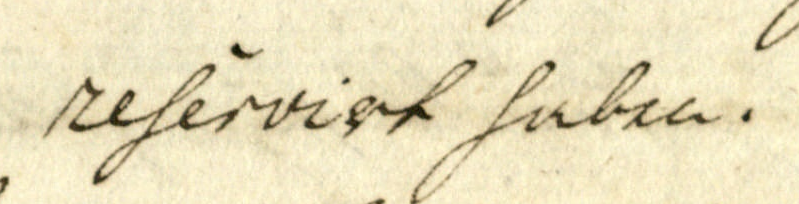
reservirt haben.
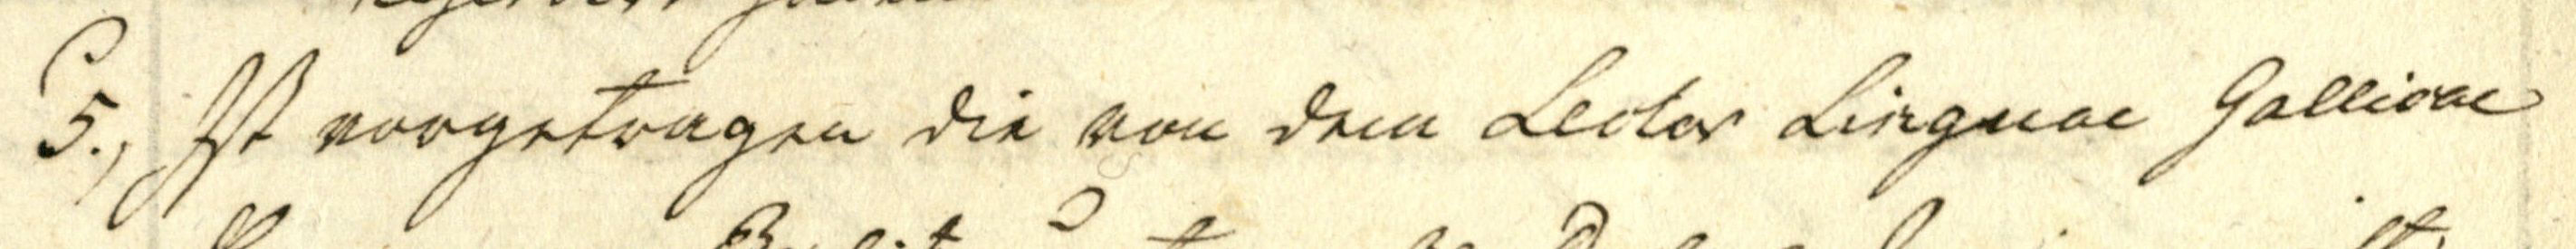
5., Ist vorgetragen die von dem Lector Linguae Gallicae
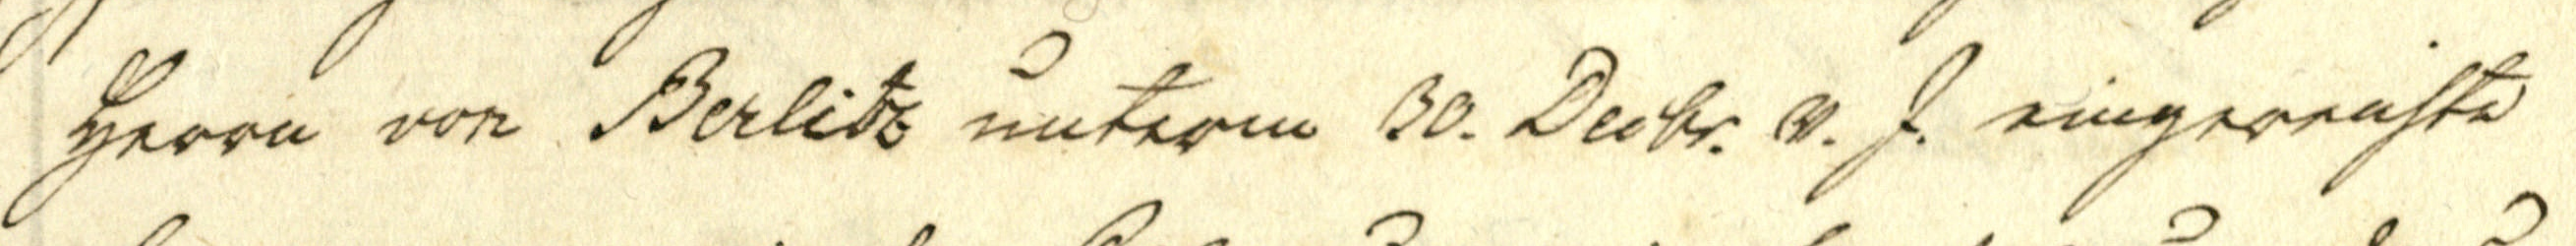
Herrn von Berlitz unterm 30. Decbr. v. J. eingereichte
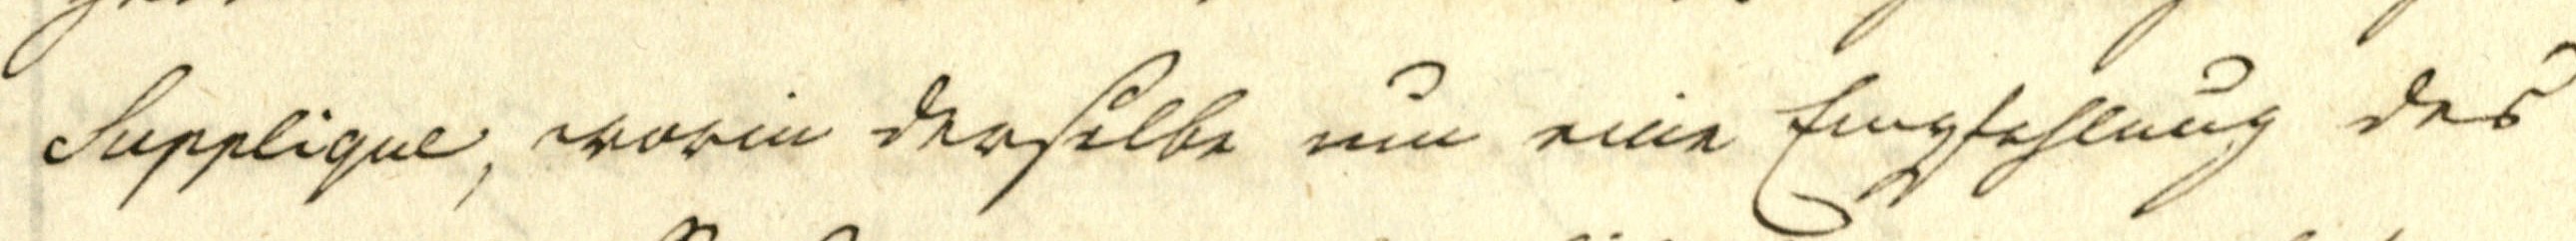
Supplique, worin derselbe um eine Empfehlung des
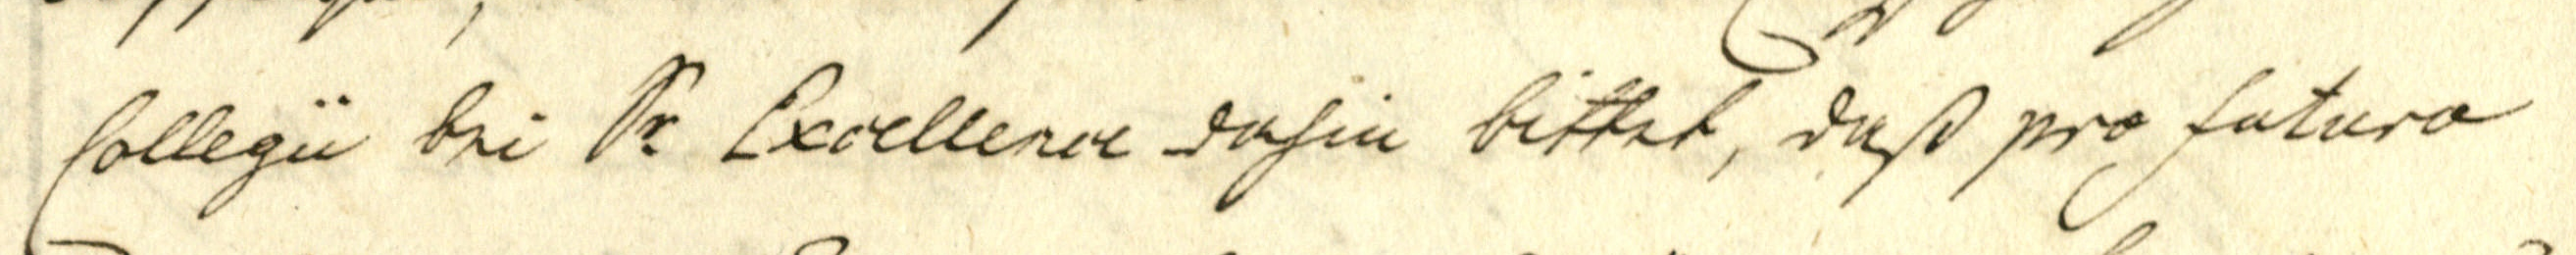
Collegii bei Sr Excellence dahin bittet, daß pro faturo
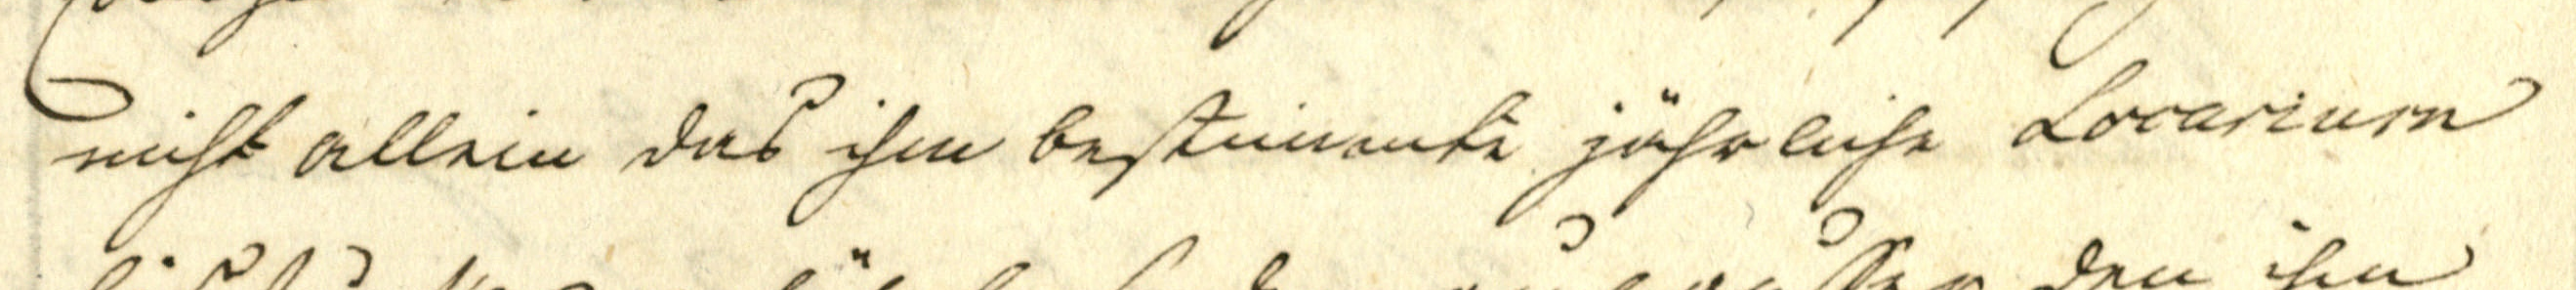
nicht allein das ihm bestimmte jährliche Locarium
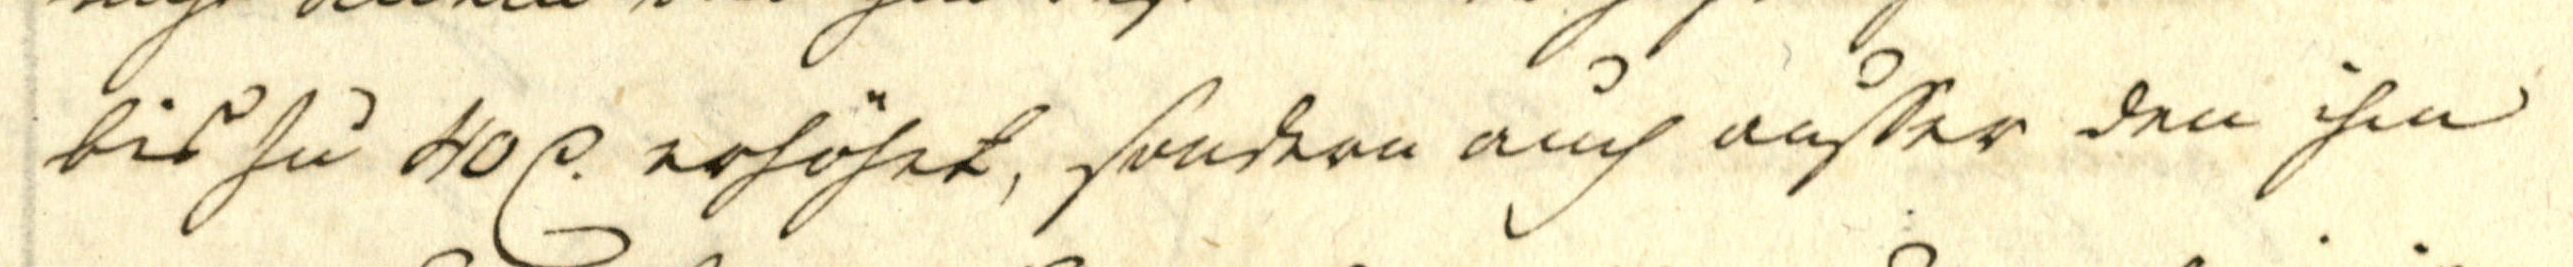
bis zu 40 l. erhöhet, sondern auch ausser den ihm
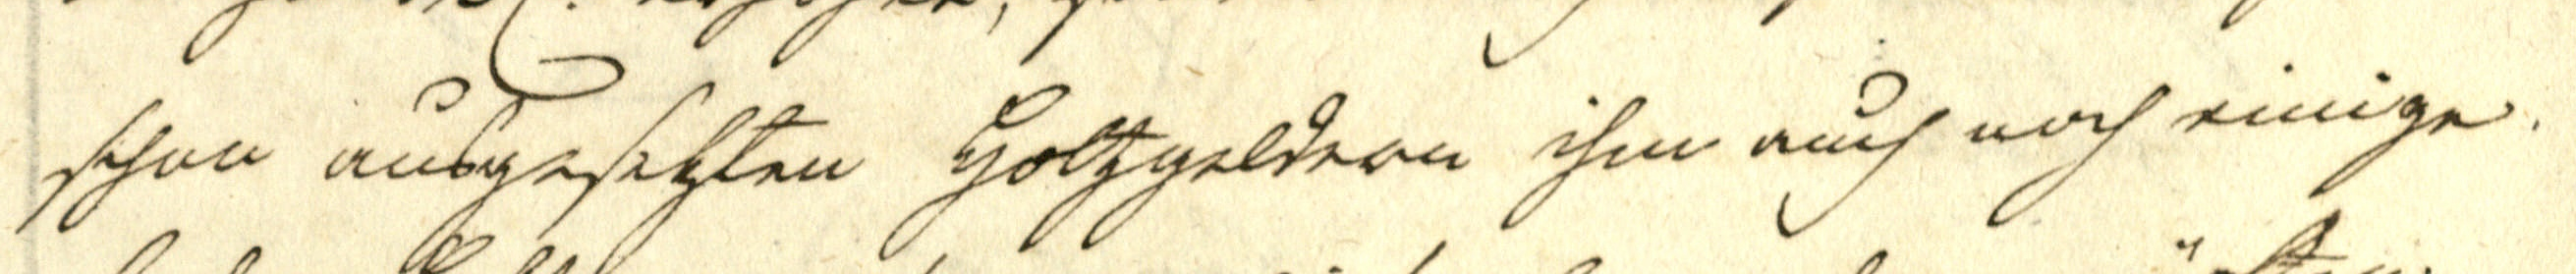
schon ausgesetzten Holtzgeldern ihm auch noch einige
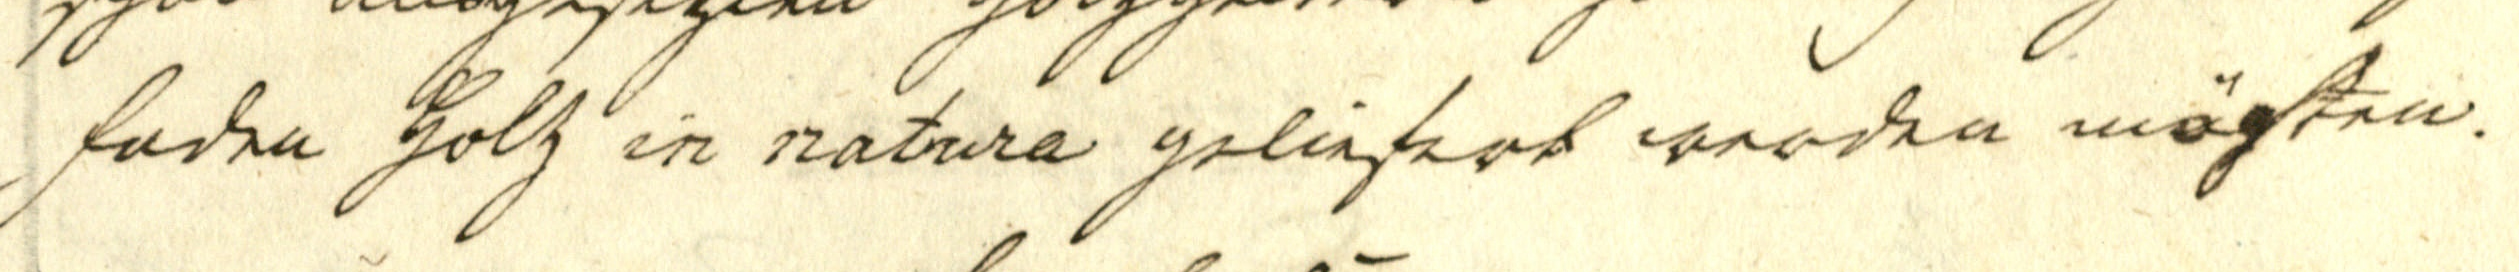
Faden Holz in natura geliefert werden mögten.
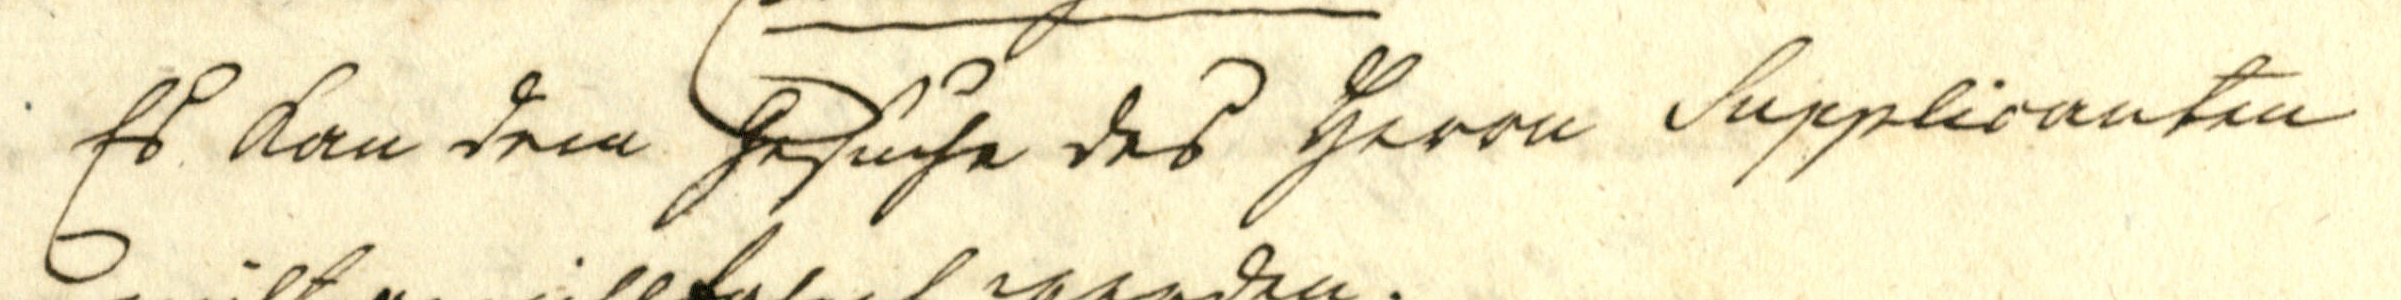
Es kan dem Gesuche des Herrn Supplicanten
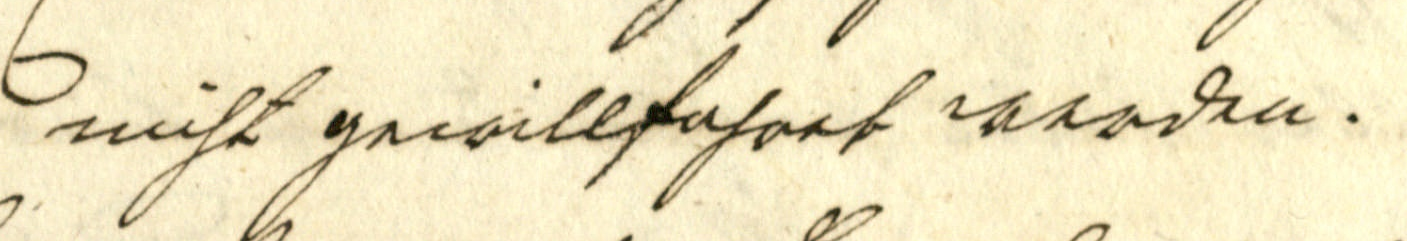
nicht gewillfahret werden.
